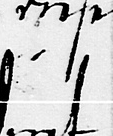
11.
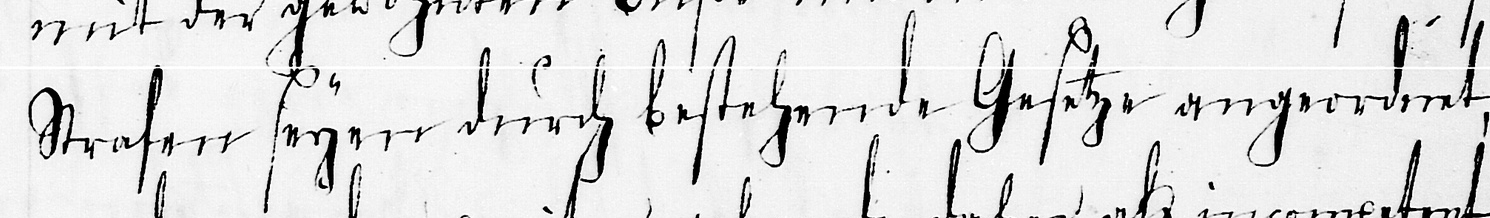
Strafen seyen durch bestehende Gesetze angeordnet,
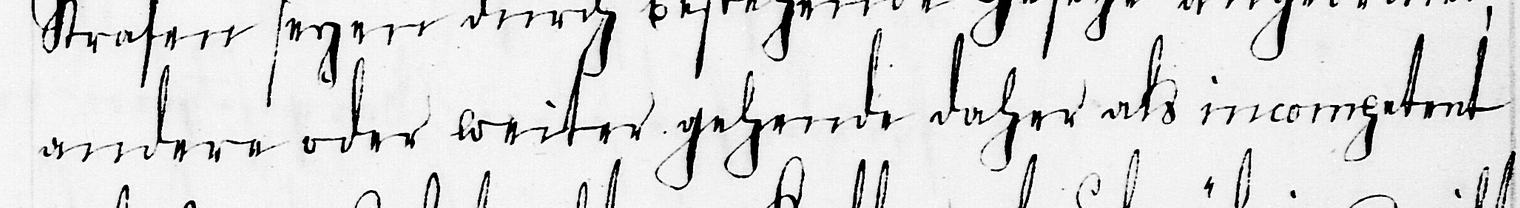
andere oder weiter gehende daher als incompetent
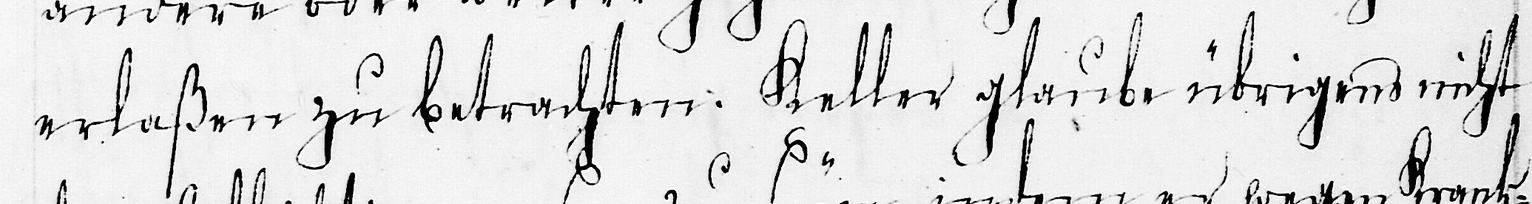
erlaßen zu betrachten. Keller glaube übrigens nicht
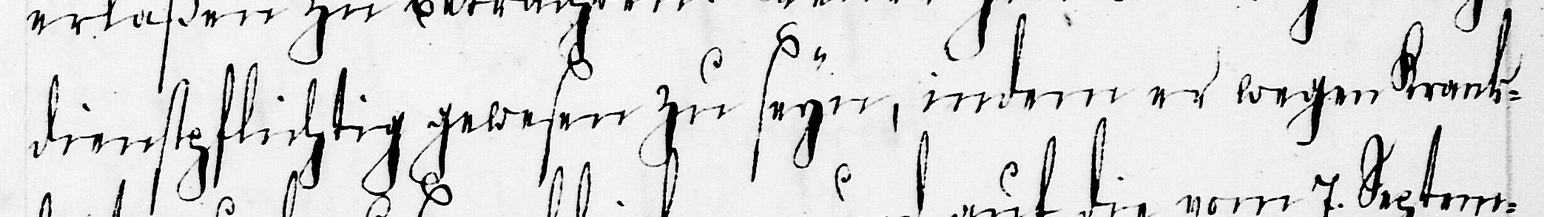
dienstpflichtig gewesen zu seyn, indem er wegen Krank¬
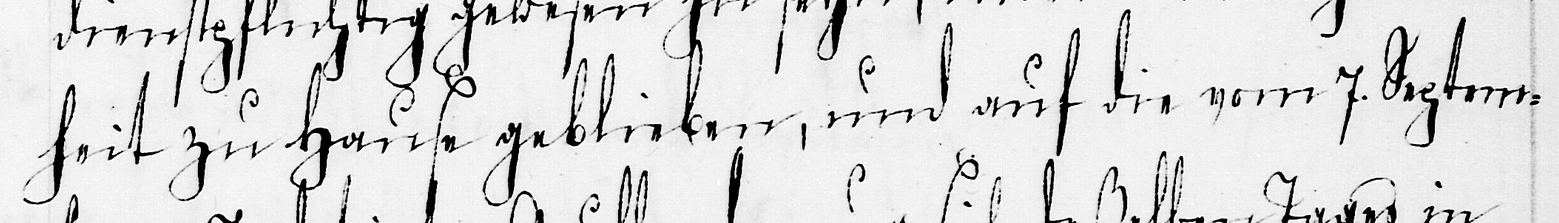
heit zu Hause geblieben, und auf die vom 7. Septem¬
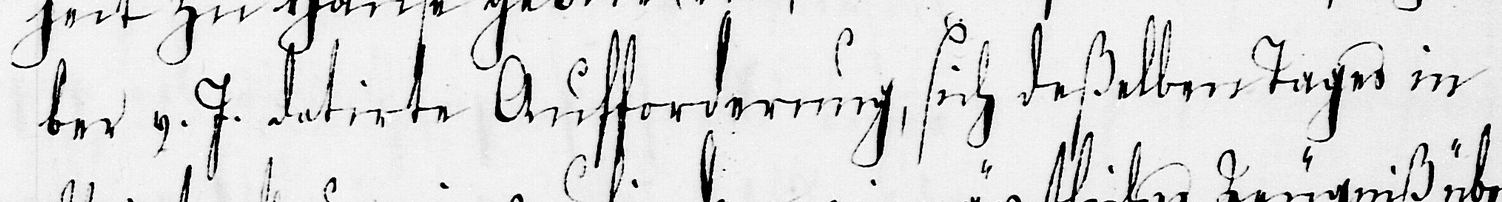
ber v. J. datirte Aufforderung, sich deßelben Tages in
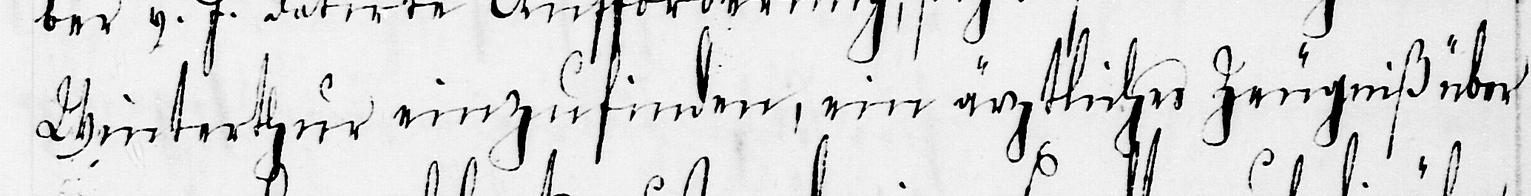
Winterthur einzufinden, ein ärztliches Zeugniß über
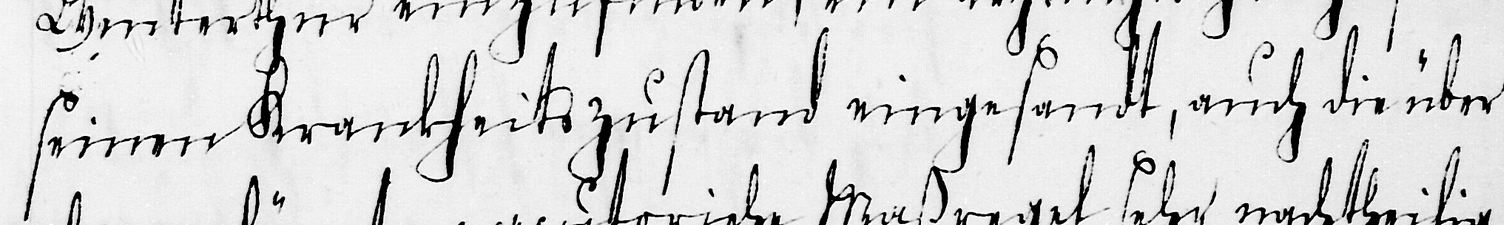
seinen Krankheitszustand eingesandt, auch die über
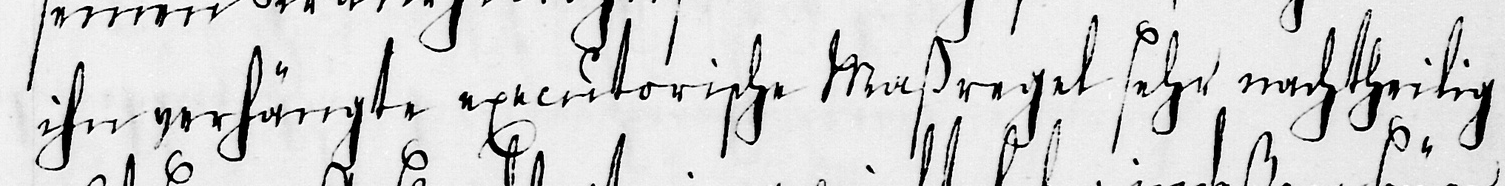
ihn verhängte executorische Maßregel sehr nachtheilig
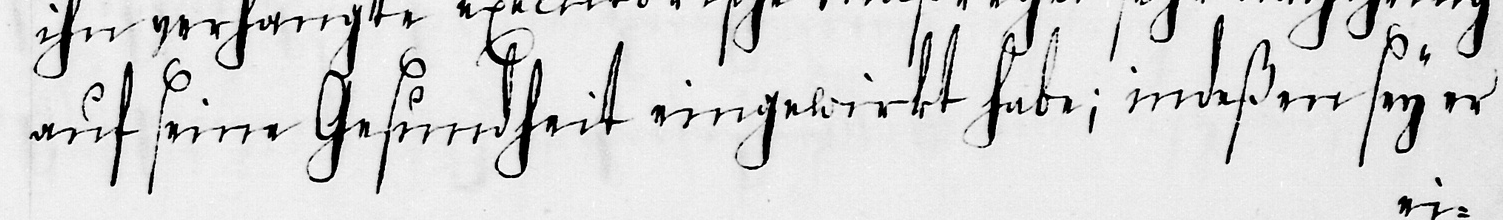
auf seine Gesundheit eingewirkt habe; indeßen sey er
